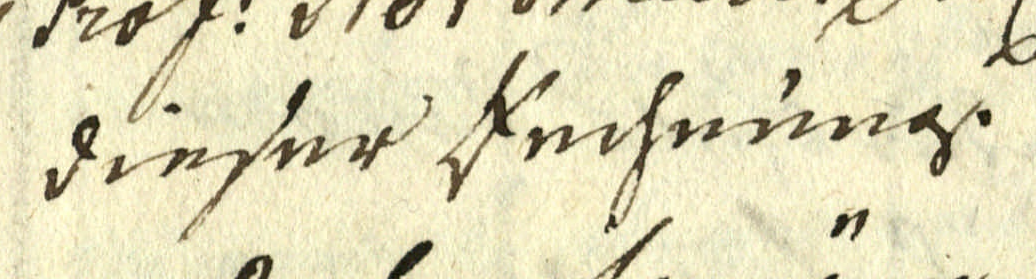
dieser Rechnung.
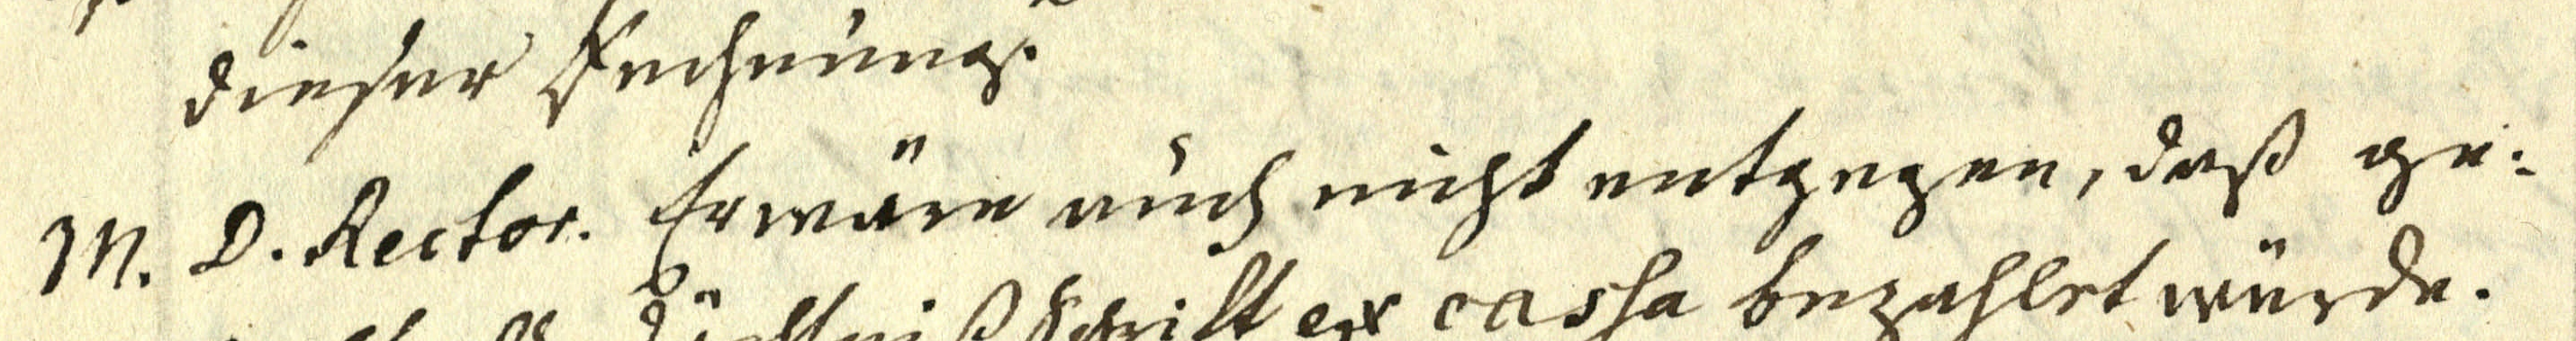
M. D. Rector. Er wäre auch nicht entgegen, daß ge¬
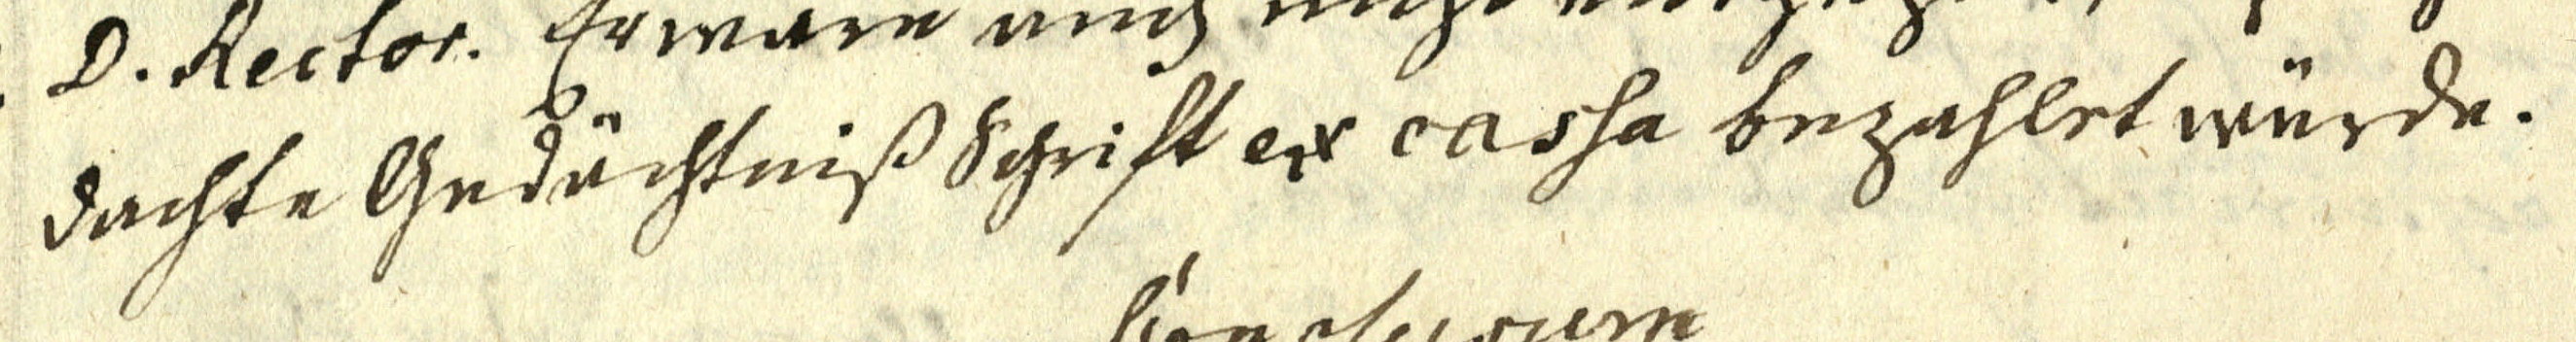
dachte Gedächtniß Schrift ex cassa bezahlet würde.
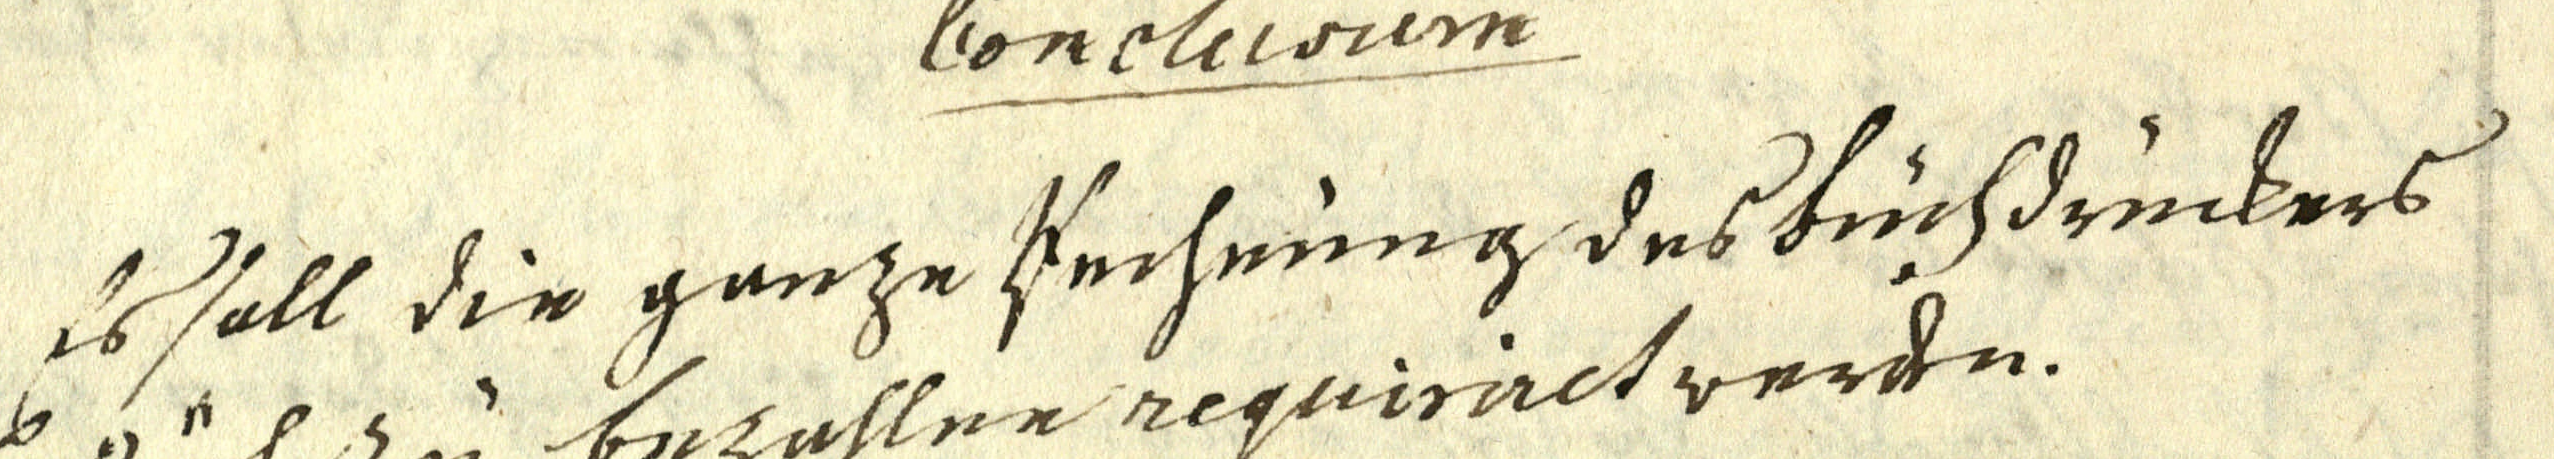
Es soll die ganze Rechnung des Buchdruckers
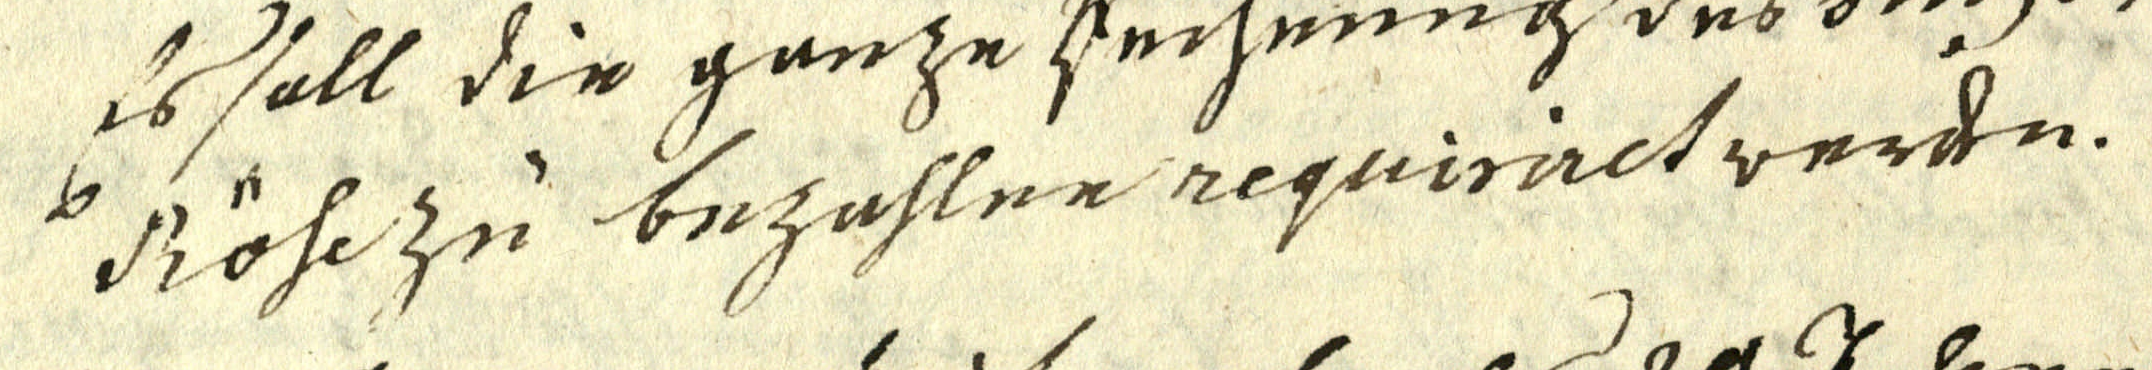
Röse zu bezahlen requiriret werden.
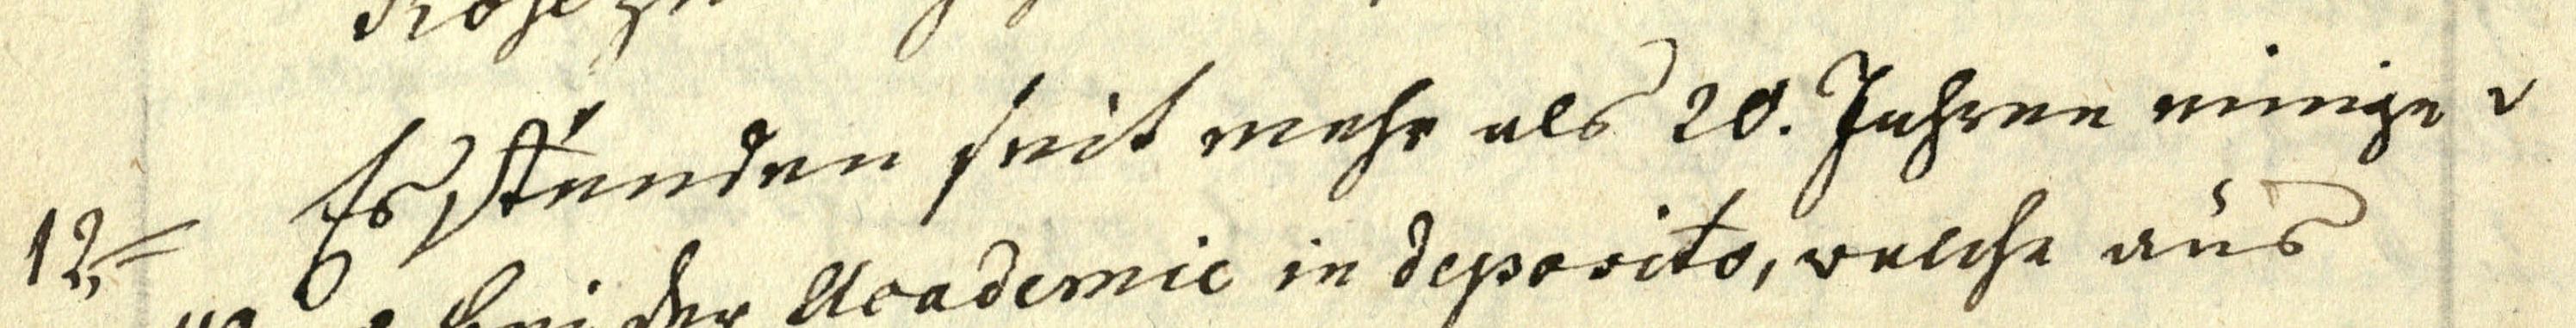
12, es stünden seit mehr als 20. Jahren einige
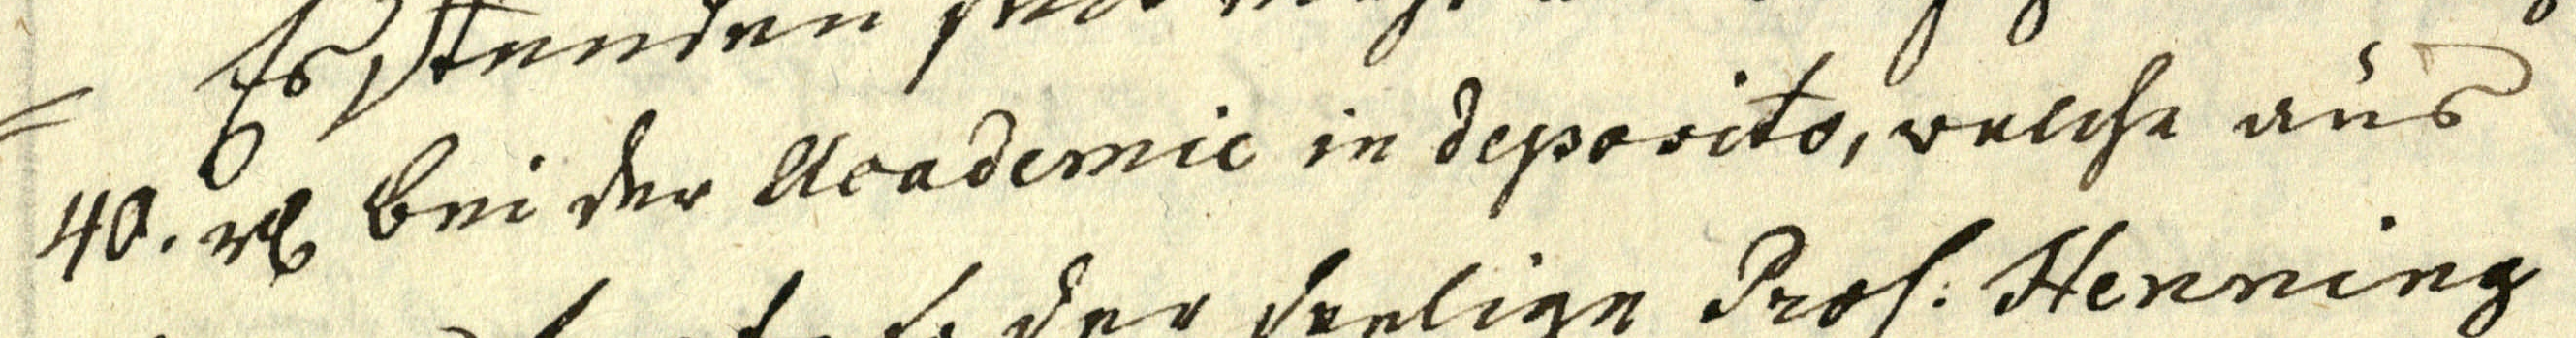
40. rl. bei der Academie in deposito, welche aus
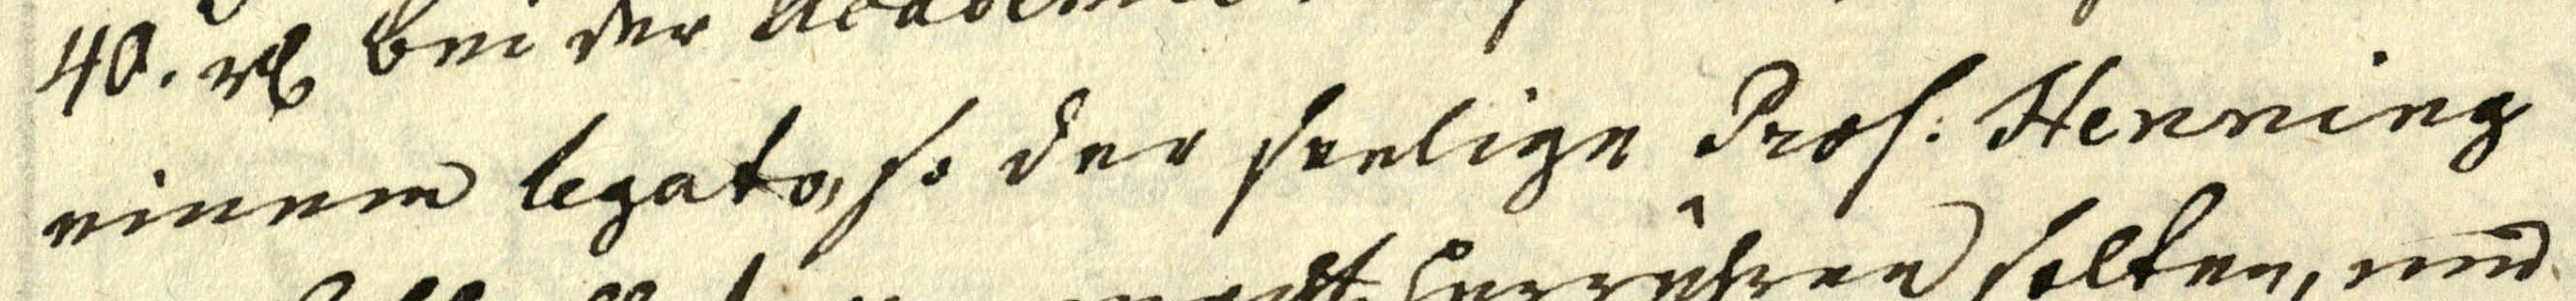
einem Legato, so der seelige Prof. Henning
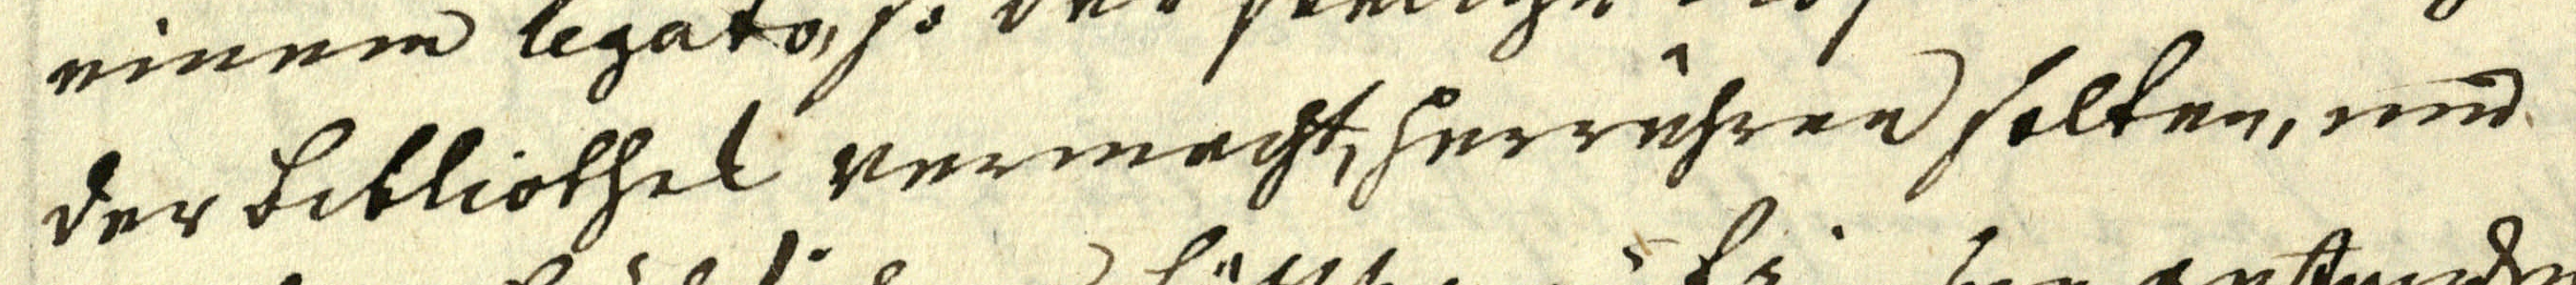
der Bibliothek vermacht, herrühren solten, und
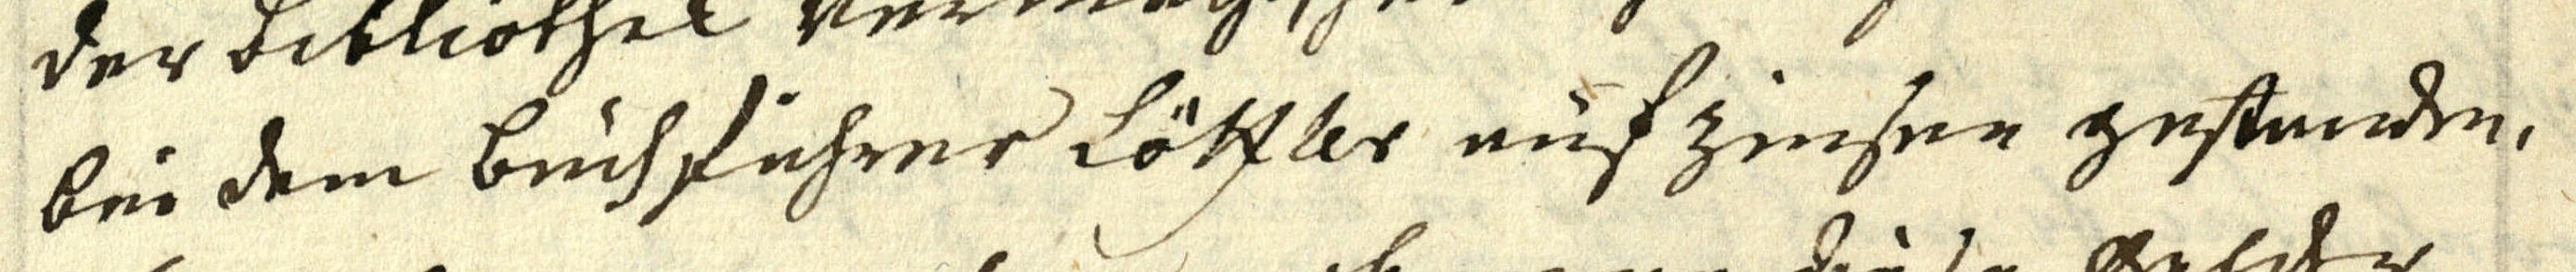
bei dem Buchführer Löffler auf Zinsen gestanden,
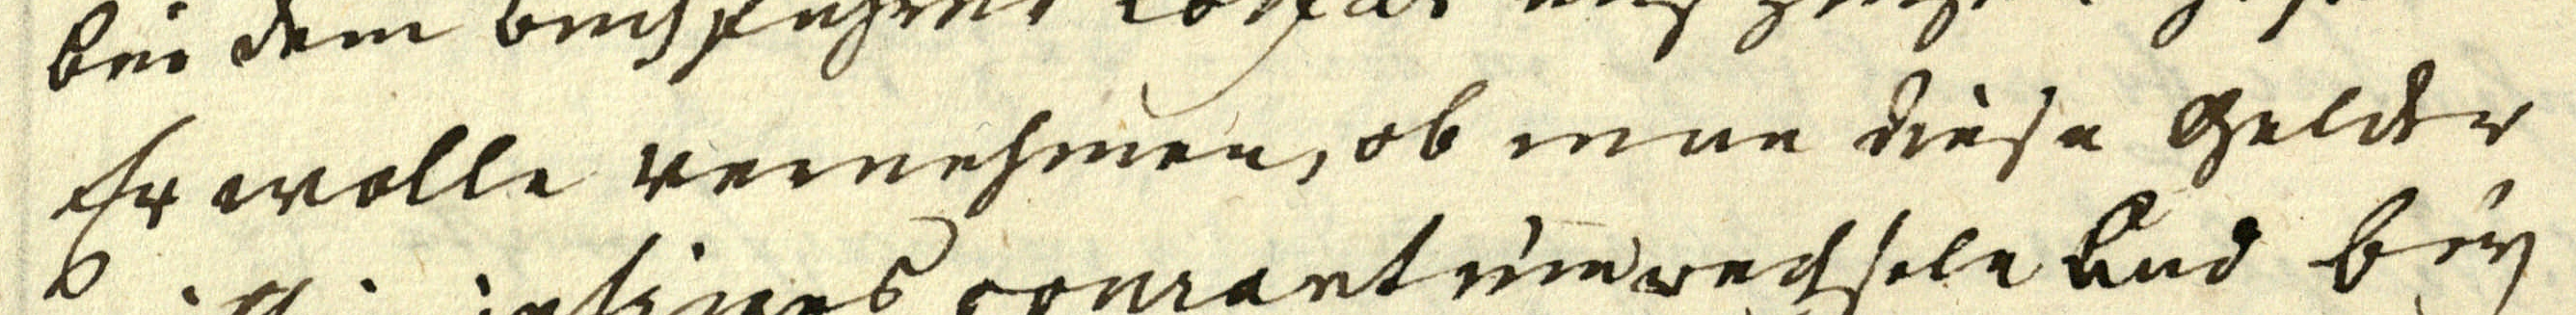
Er wolle vernehmen, ob man diese Gelder
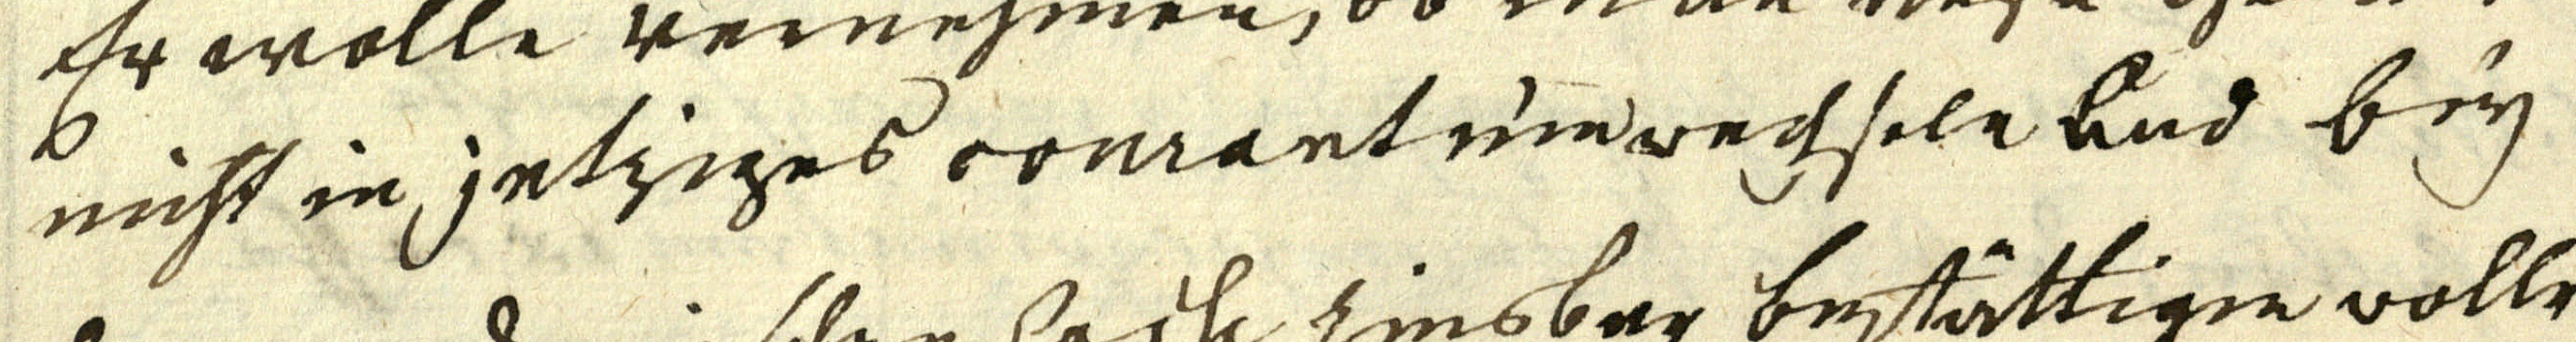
nicht in jetziges courant umwechseln und beÿ
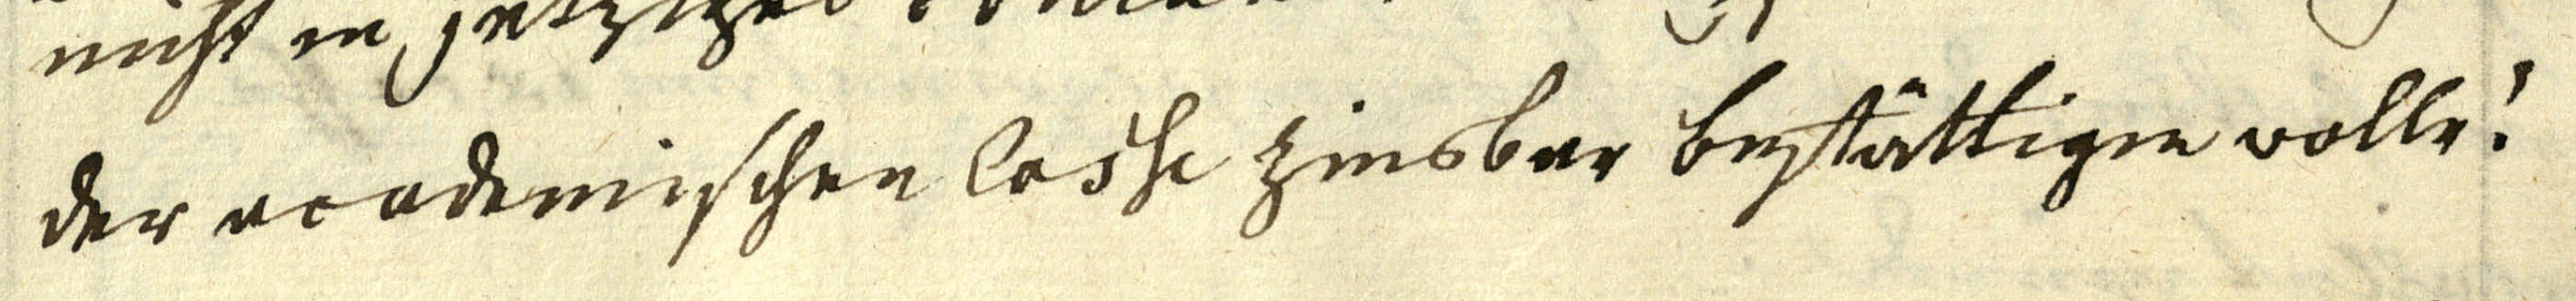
der academischen Casse zinsbar bestättigen wolle?
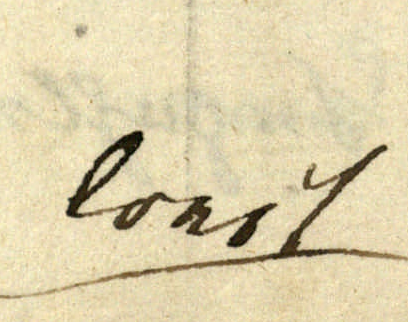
Concl
